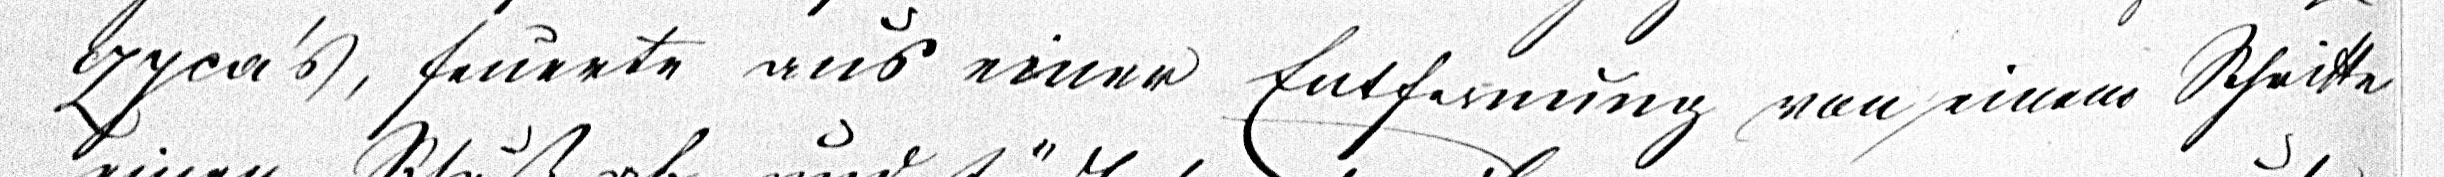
zyca's, feuerte aus einer Entfernung von einem Schritte
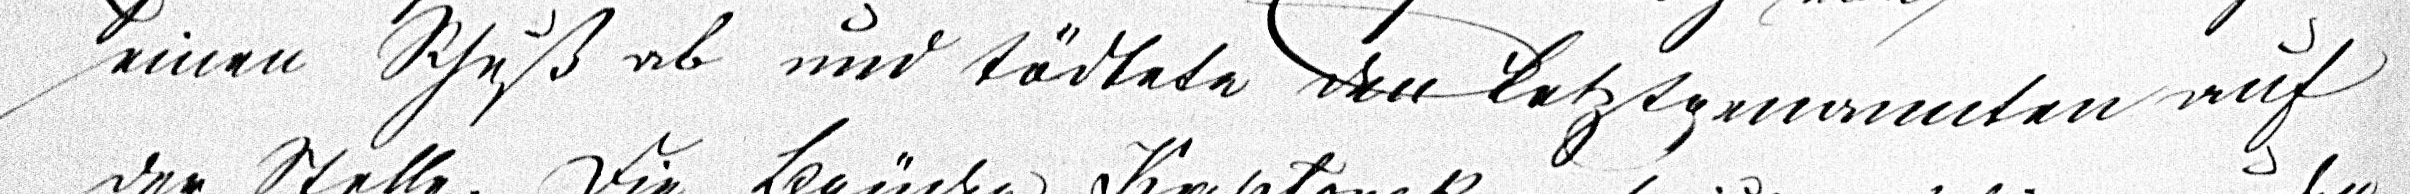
einen Schuß ab und tödtete den letztgenannten auf
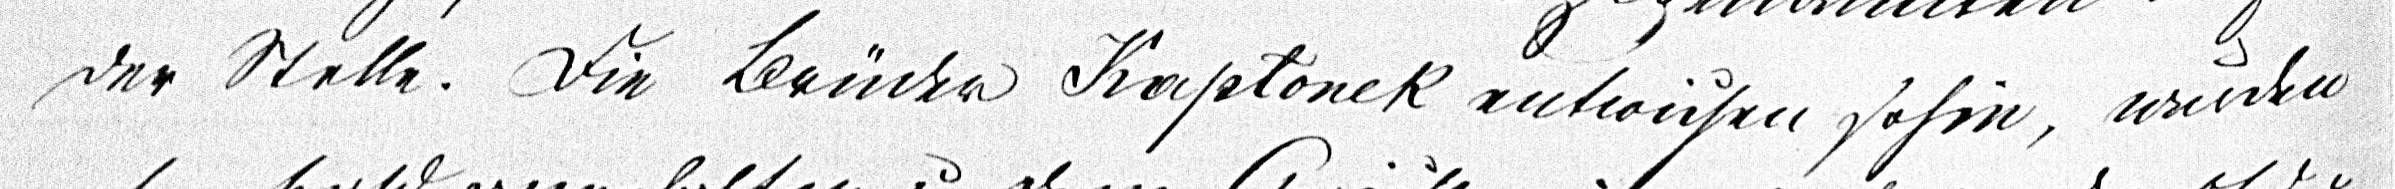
der Stelle. Die Brüder Kaptonek xx sohin, wurden
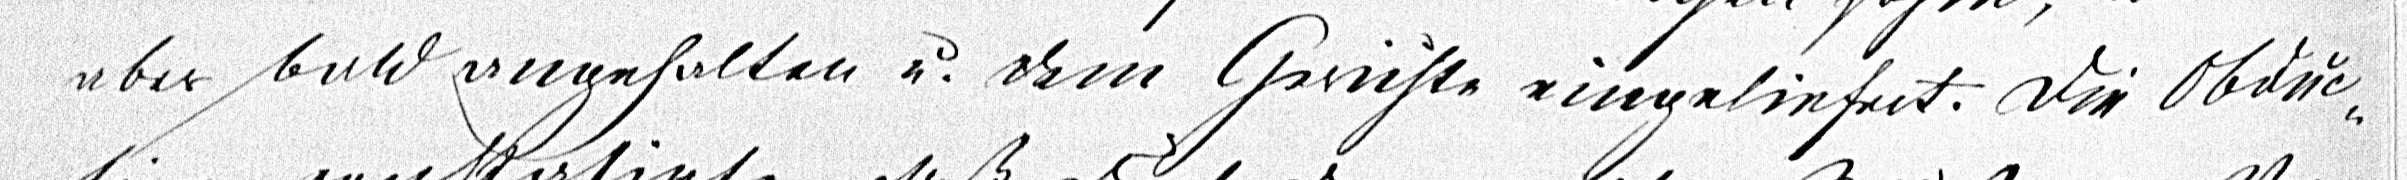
aber bald Angehalten u. dem Gerichte eingeliefert. Die Obduc¬
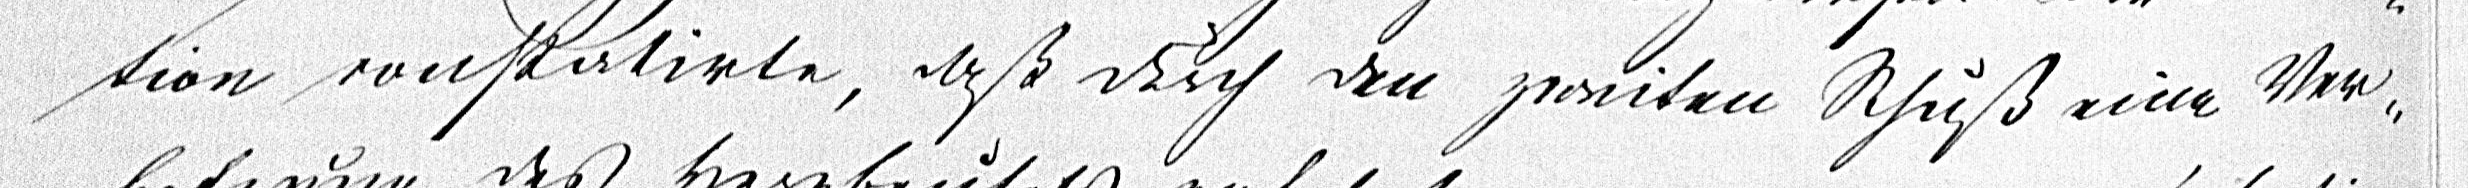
tion constatirte, daß durch den zweiten Schuß eine Ver¬
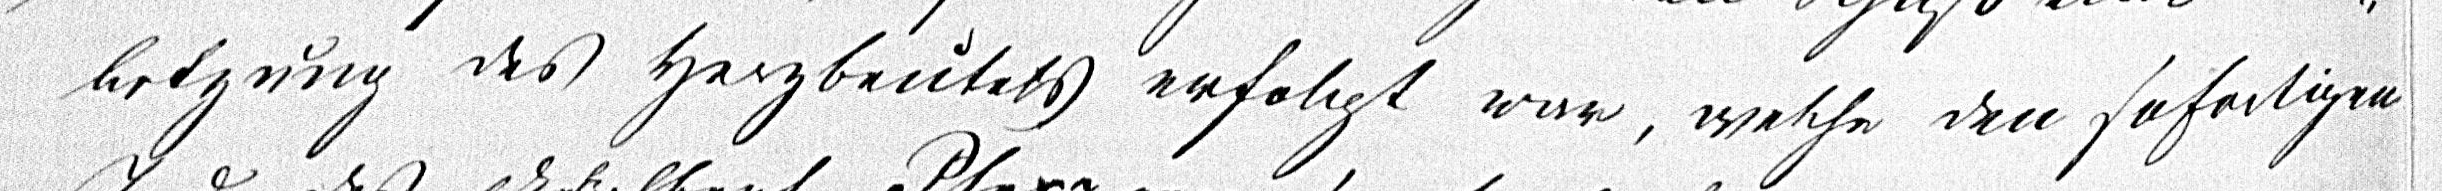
letzung des Herzbeutels erfolgt war, welche den sofortigen
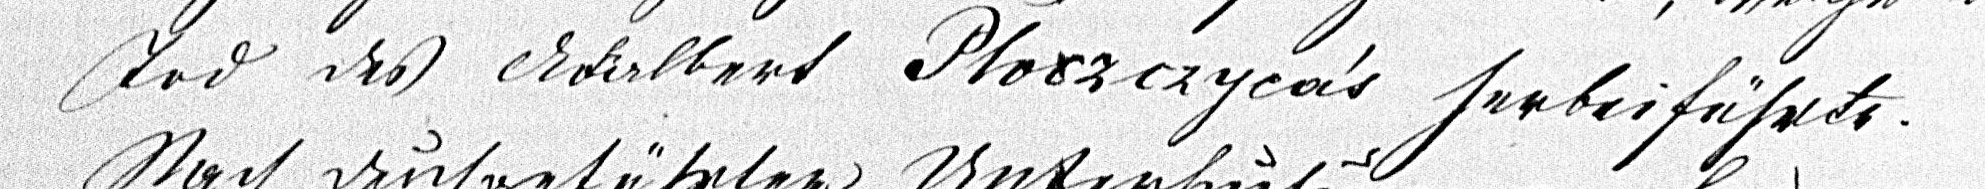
Tod des Adalbert Ploszczycás herbeiführte.
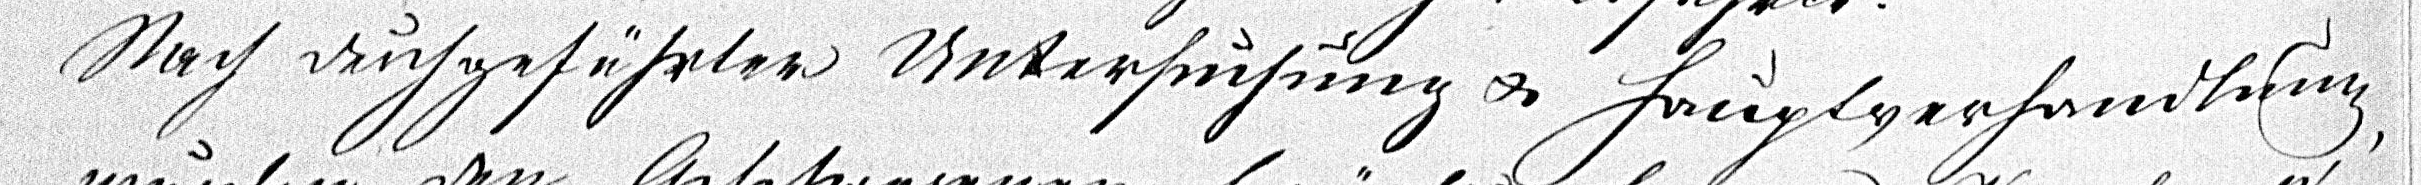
Nach durchgeführter Untersuchung xx. Hauptverhandlung,
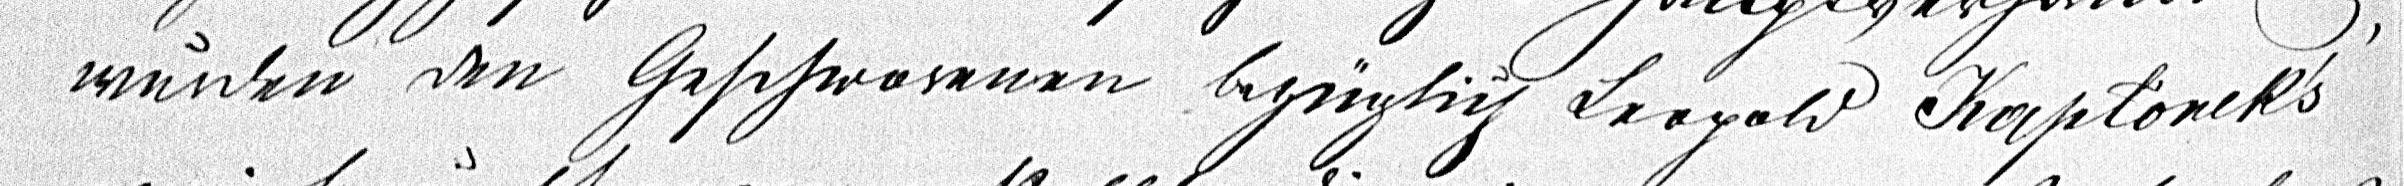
wurden den Geschworenen bezüglich Leopold Kaptonek's
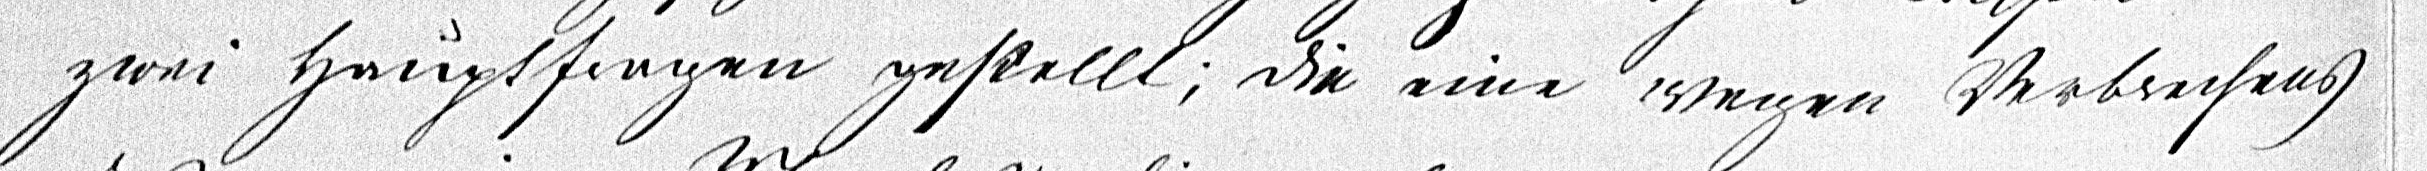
zwei Hauptfragen gestellt; die eine wegen Verbrechens
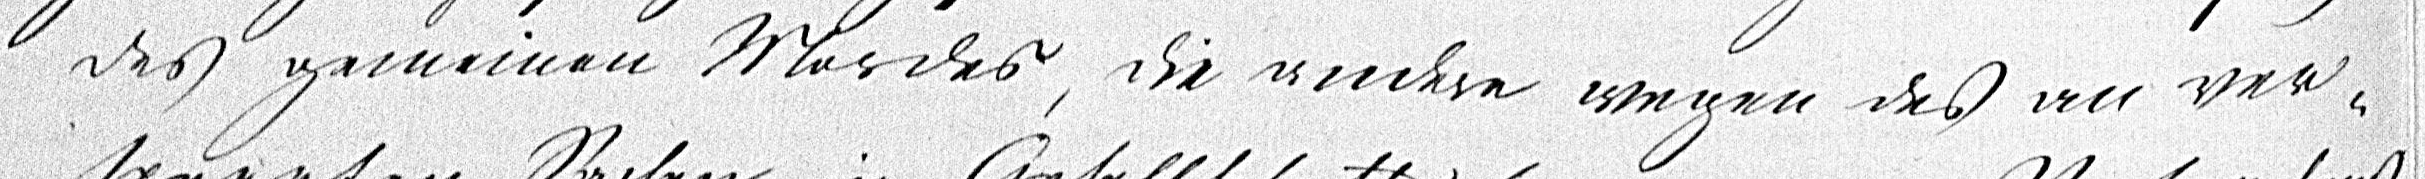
des gemeinen Mordes, die andere wegen des an ver¬
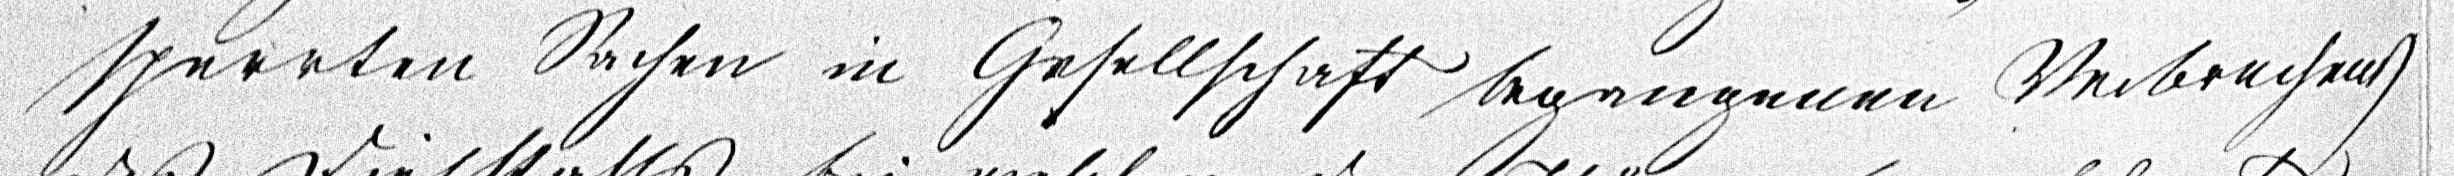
sperrten Sachen in Gesellschaft begangenen Vebrechens
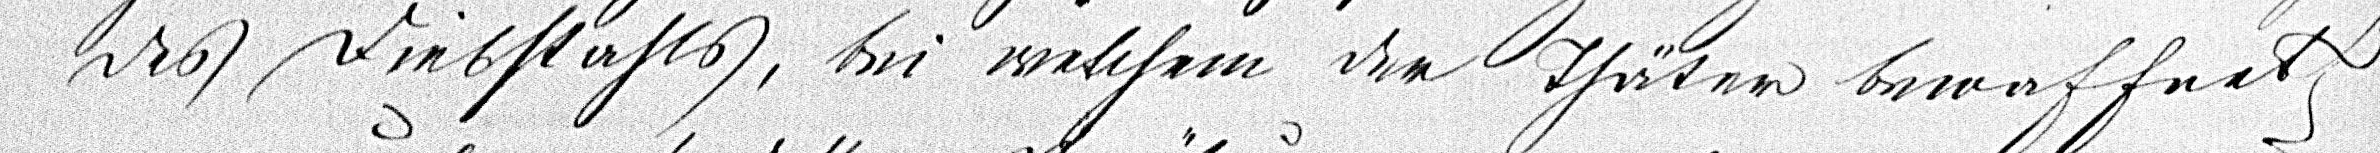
des Diebstahls, bei welchem der Thäter bewaffert
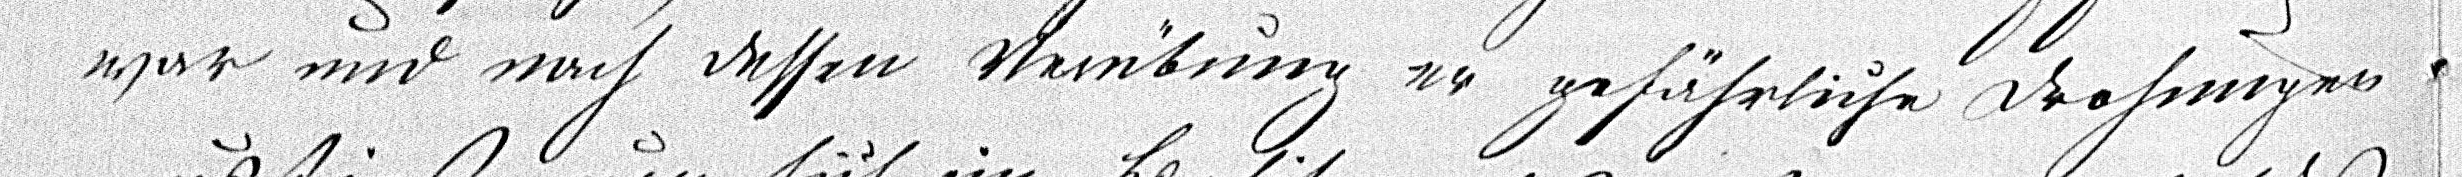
war und nach dessen Verübung er gefährliche Drohungen
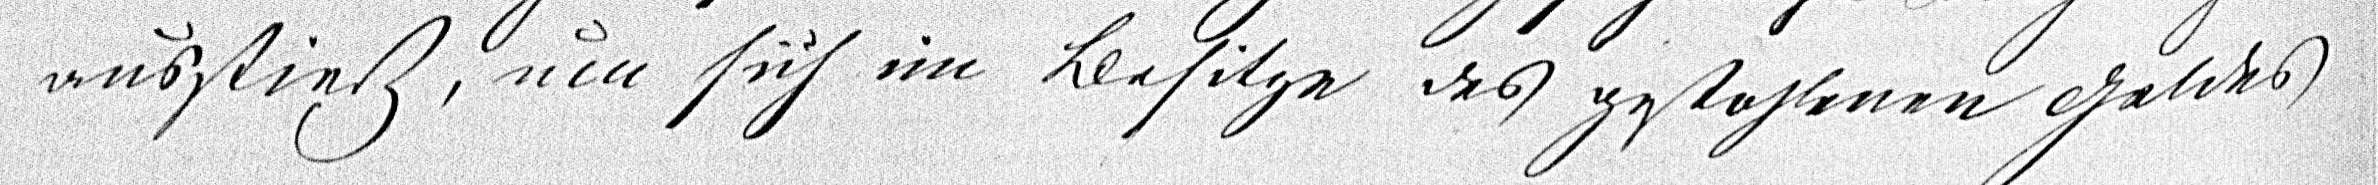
ausstieß, um sich im Besitze des gestohlenen Geldes
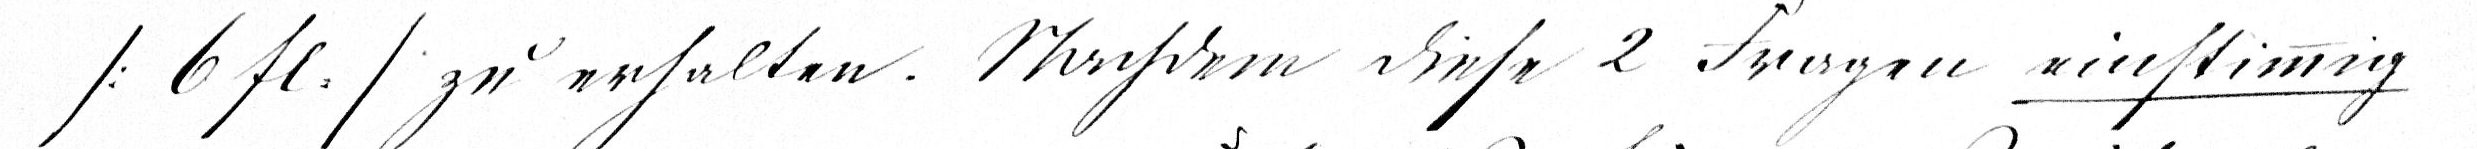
/:6 fl.:/ zu erhalten. Nachdem diese 2 Fragen einstimmig
